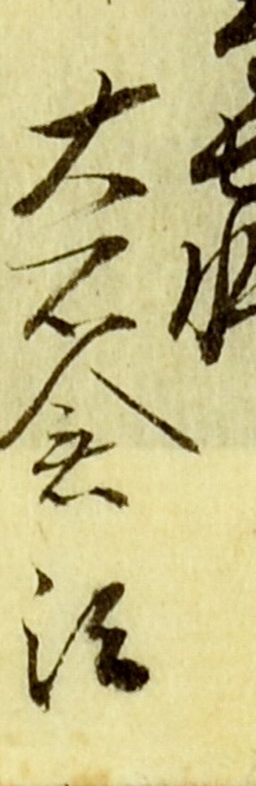大石倉治
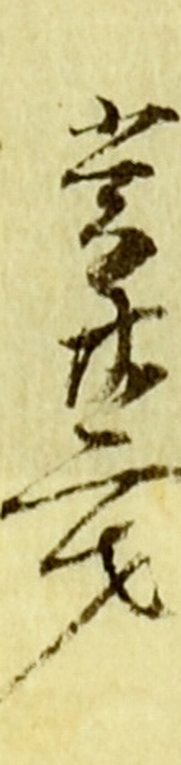当廿二才
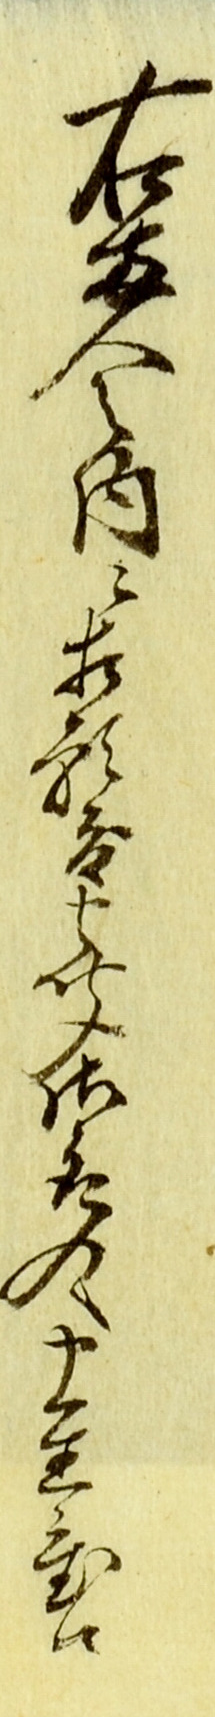右両人之内ニ相頼度申聞御取入申達置候
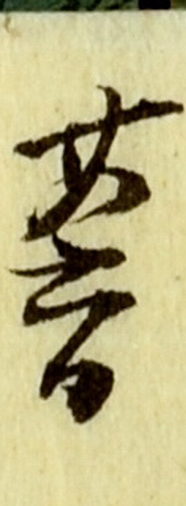廿六日
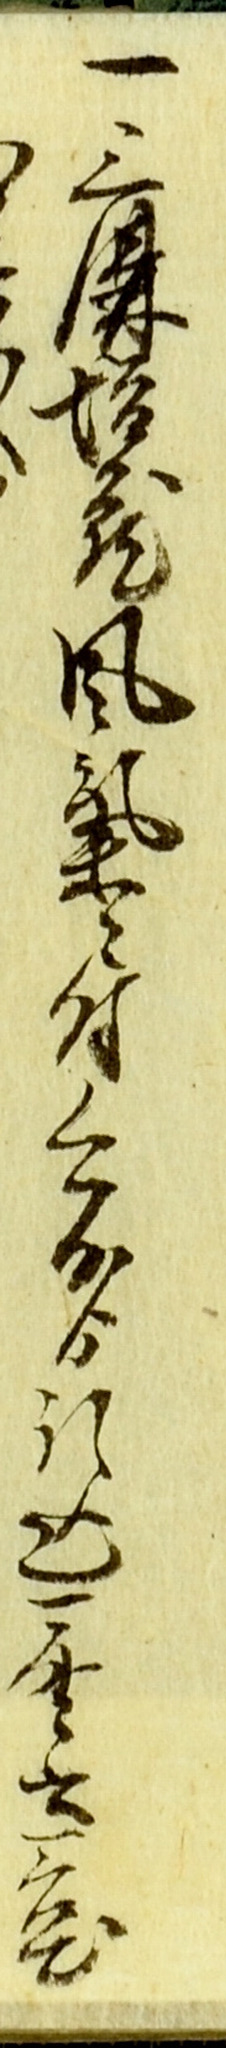一三溝増蔵風気ニ付今日ゟ引込届書差出
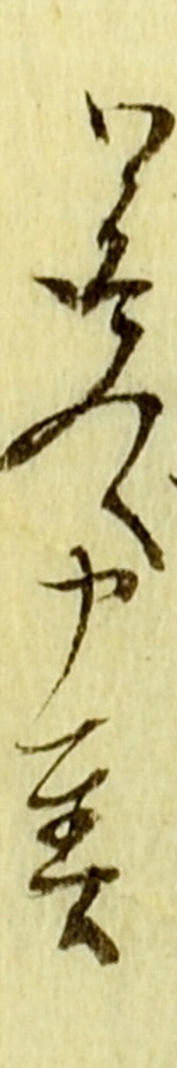御取〆へ申達候
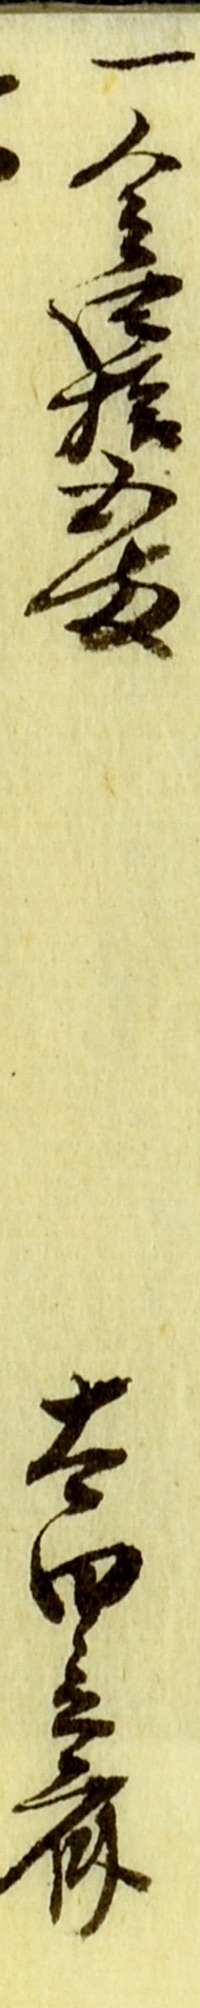一金四拾五両太田立斎
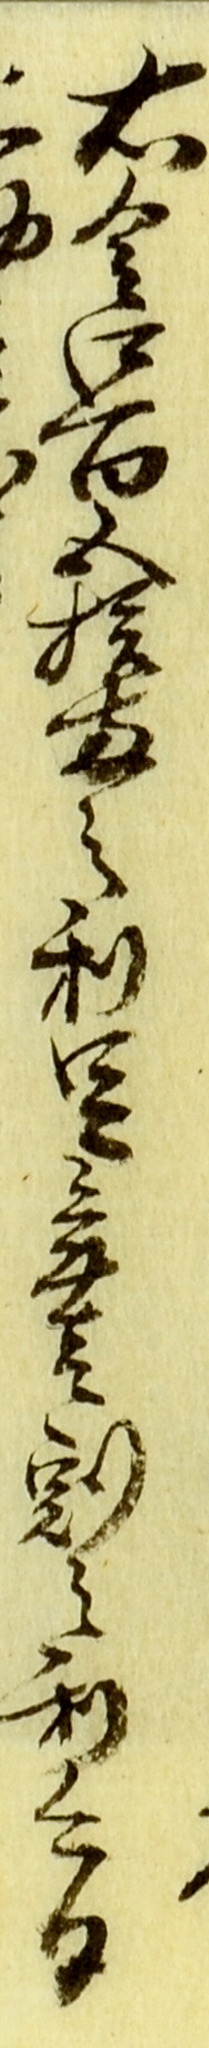右金四百五拾両之利足年共ニ割之利今日

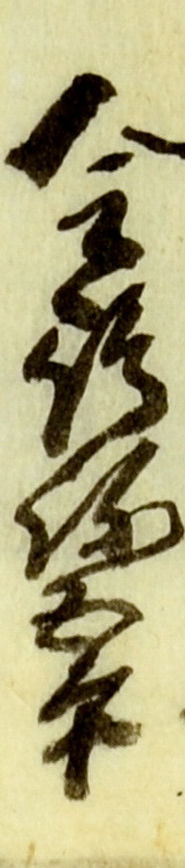金嶋弥五平
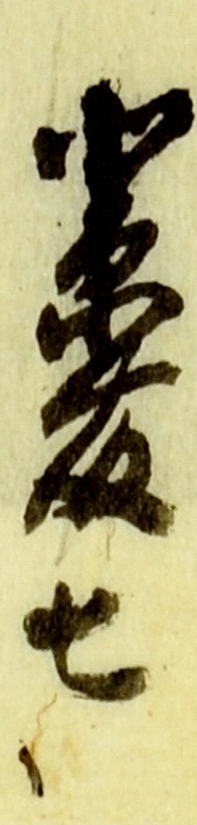北原藤七
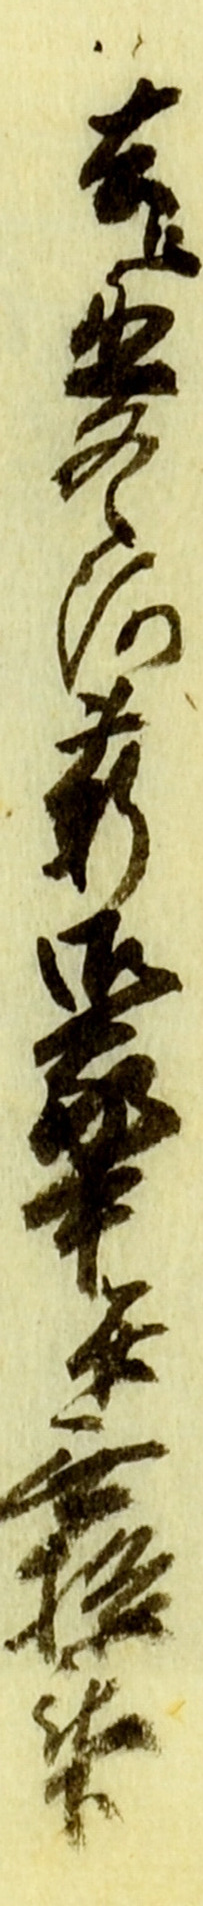去ル丑冬河薪御家中幷無格被下
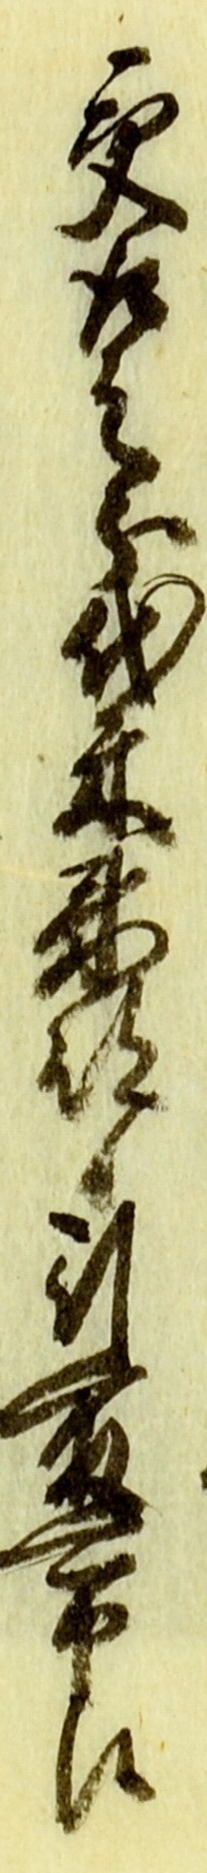受取之分代米来朔日引取可申候
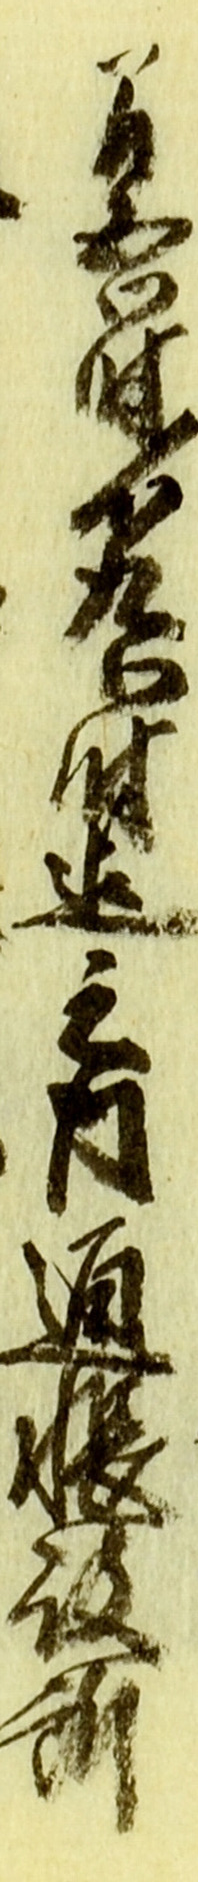間五ツ時ゟ九ツ時迄之内通帳役所
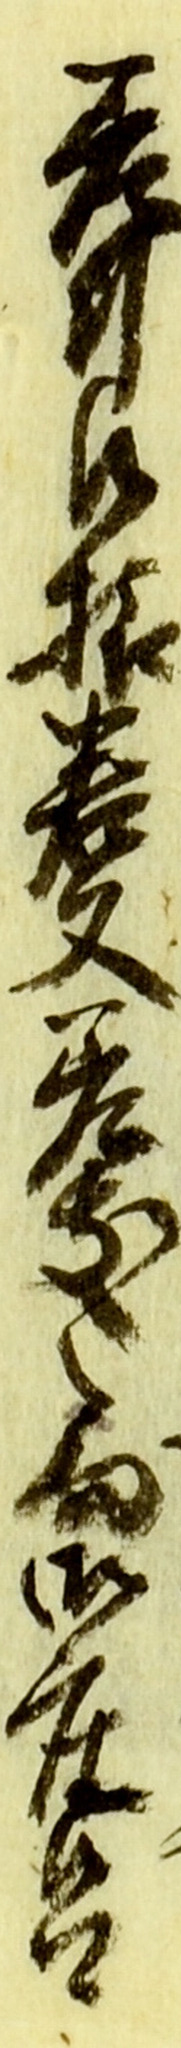差引候様若又差支之向御座候ハゝ
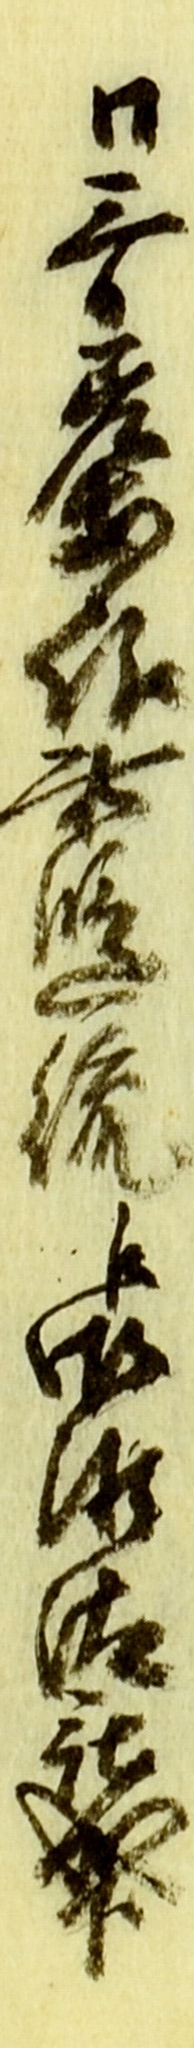同三日差出様此段一統江御沙汰被成下
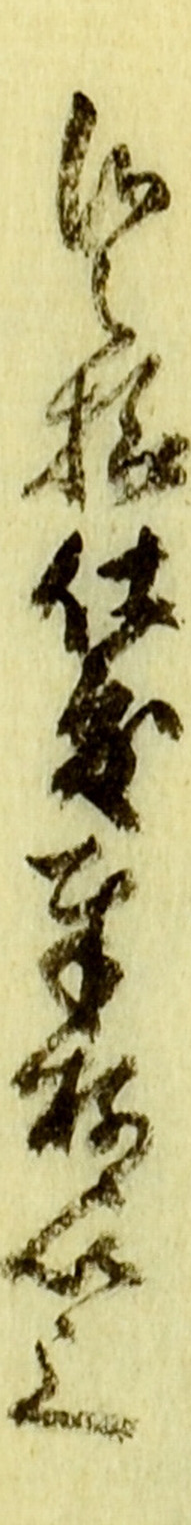候之様仕度奉存候以上
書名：諸事御用留
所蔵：伊那市立高遠町図書館・合同会社AMANE
